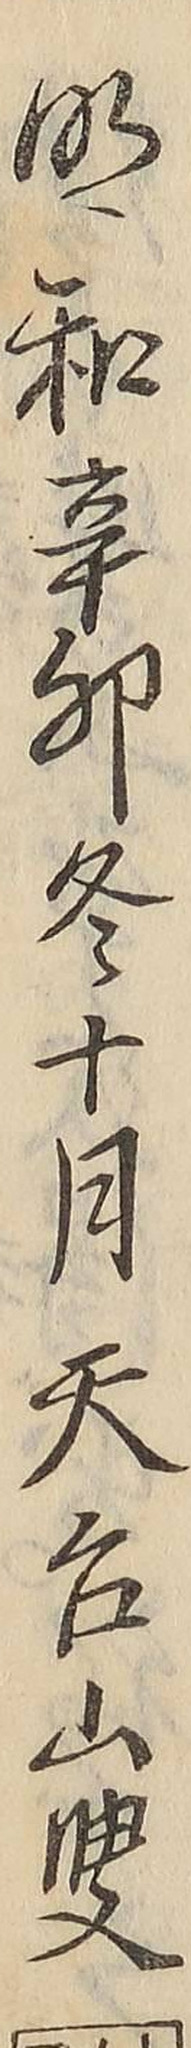明和辛卯冬十月天台山叟
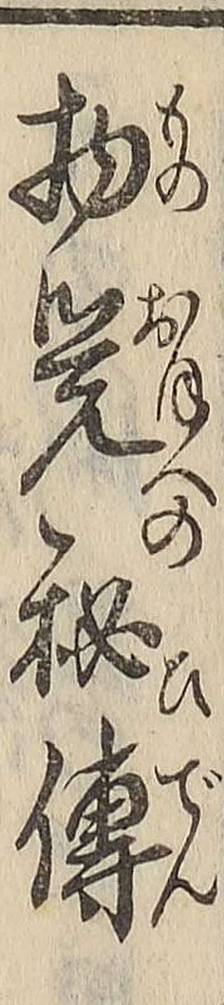物覚秘伝
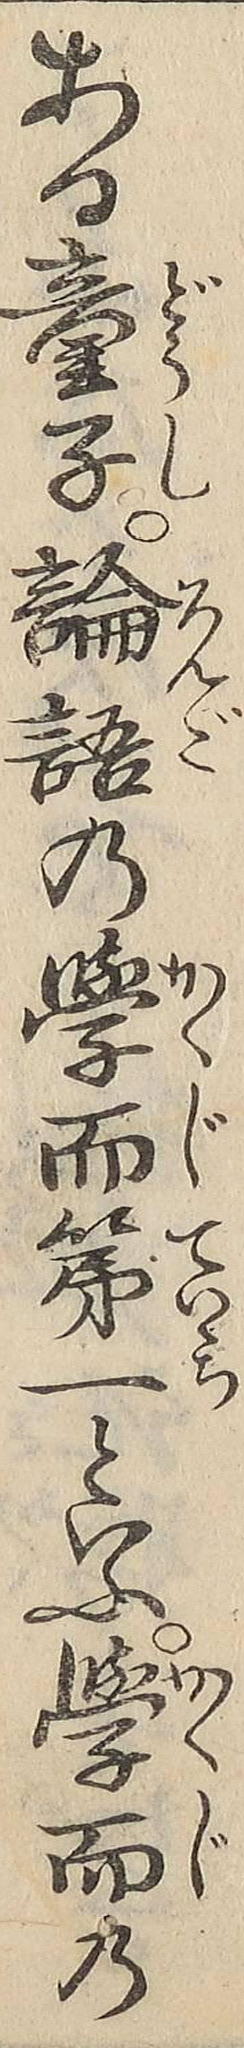ある童子。論語の学而第一といふ。学而の
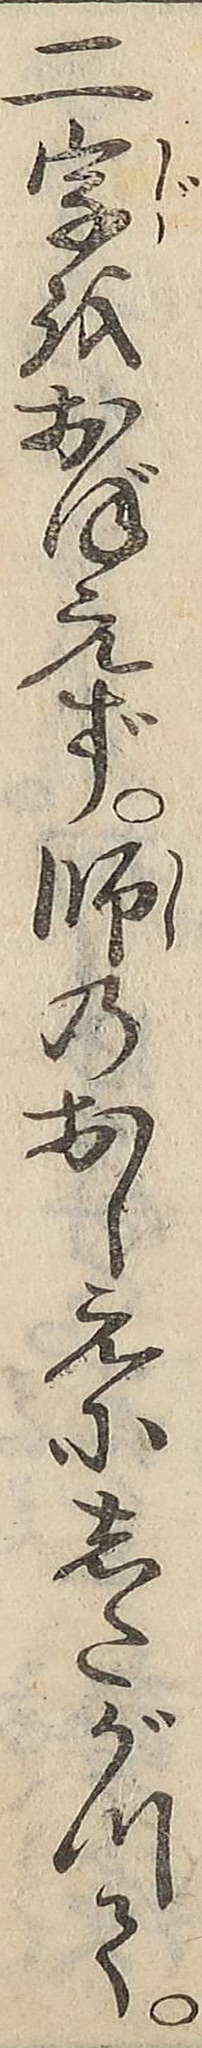二字をおぼえず。師のおしえにしたがつて。
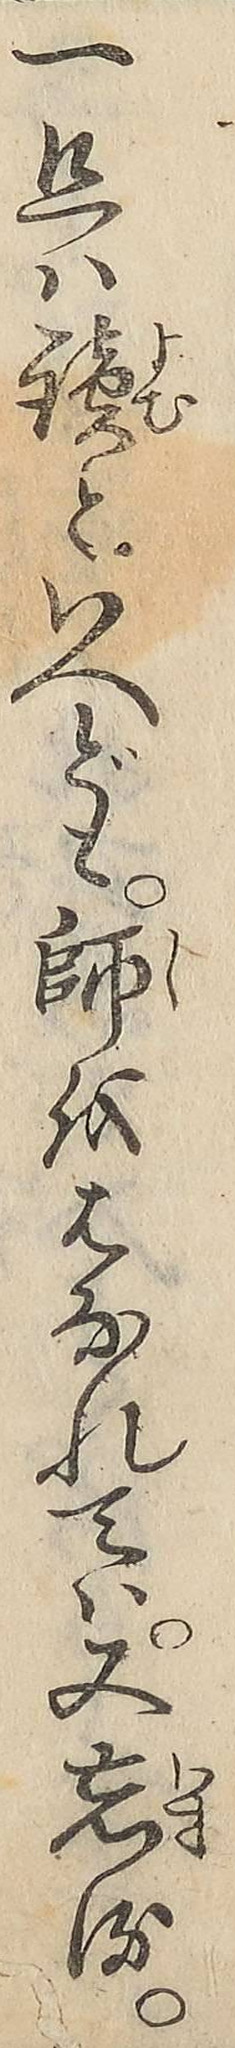一旦は読といへども。師をはなれては。又忘る。
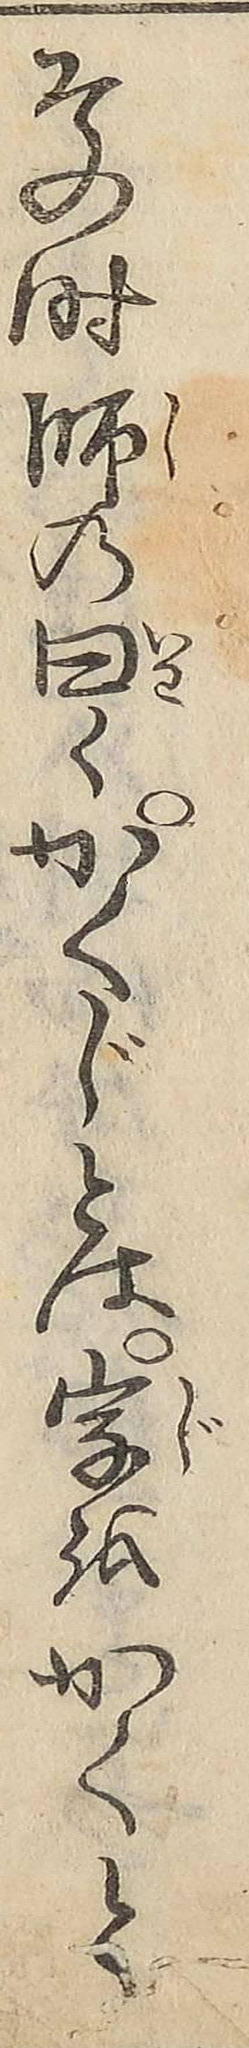その時師の曰く。かくじとは。字をかくと
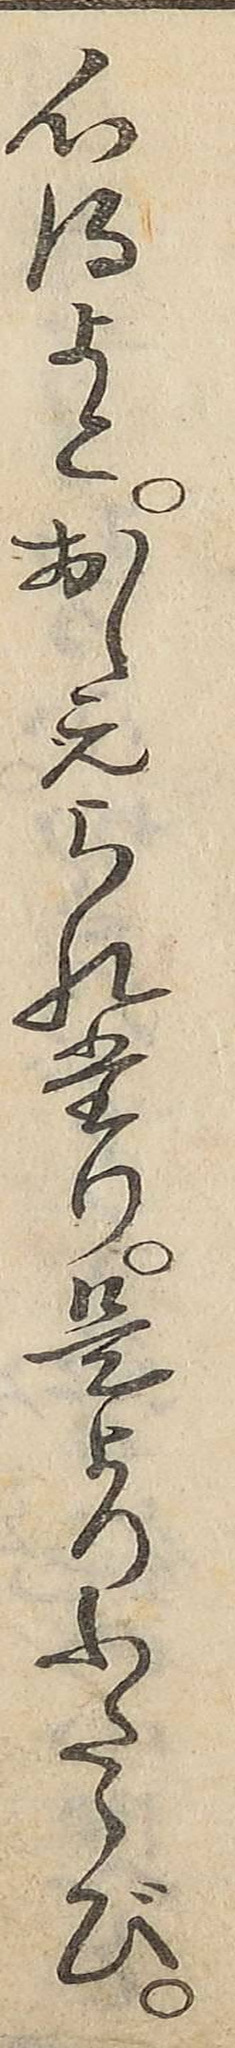心得よと。おしえられたり。是よりふたゝび。
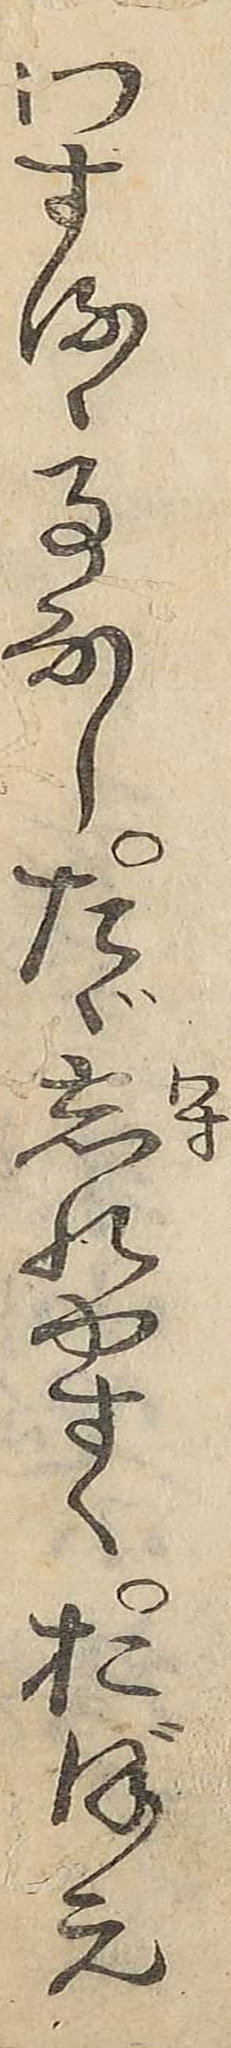わするゝ事なし。たゞ忘れやすく。おぼえ

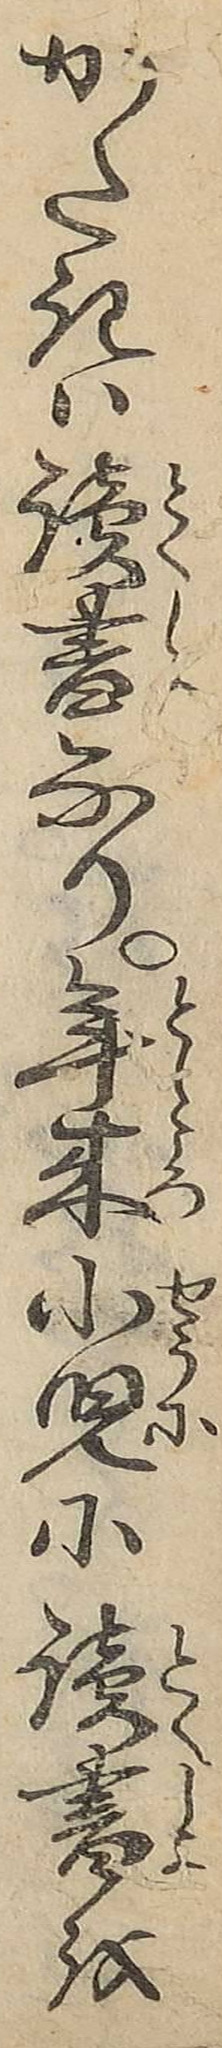かたきは読書なり。年来小児に読書を
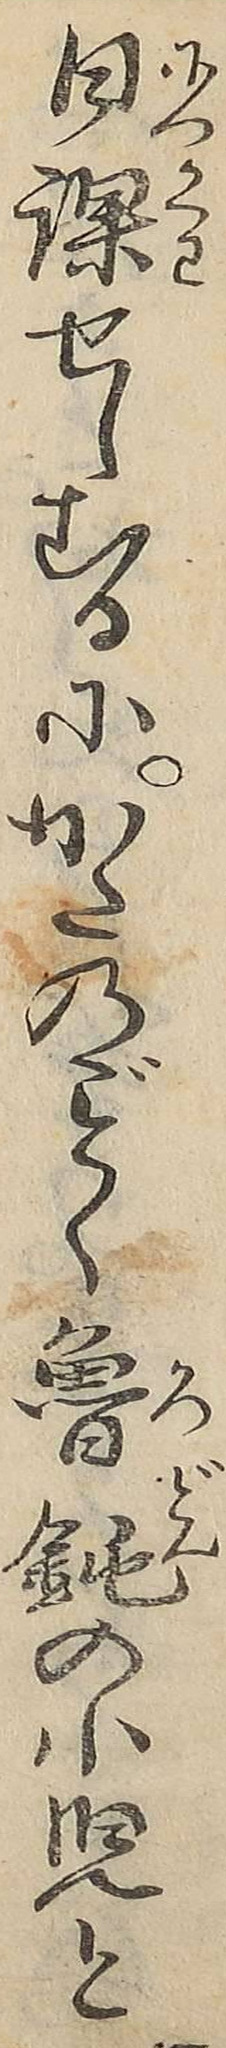日課せしむるに。かたのごとく魯鈍の小児と
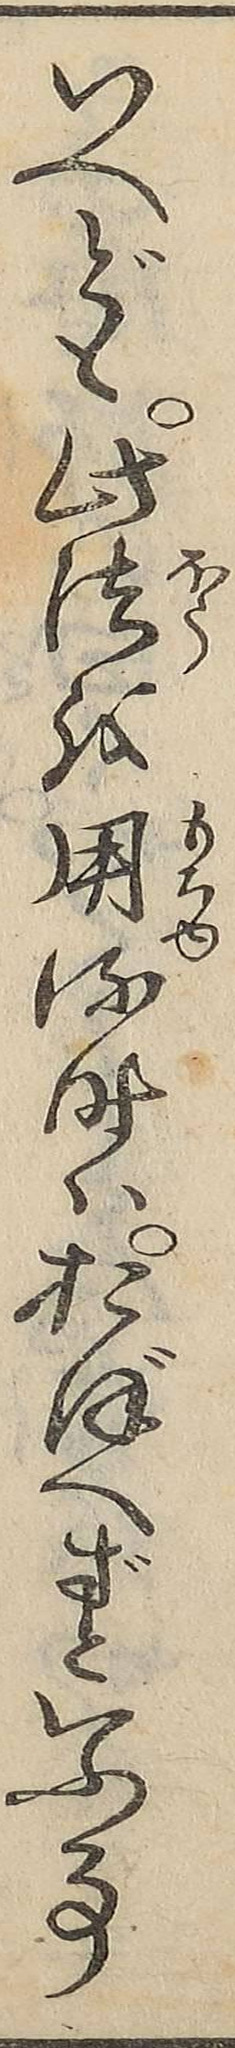いへども。此法を用る時は。おぼへずといふ事
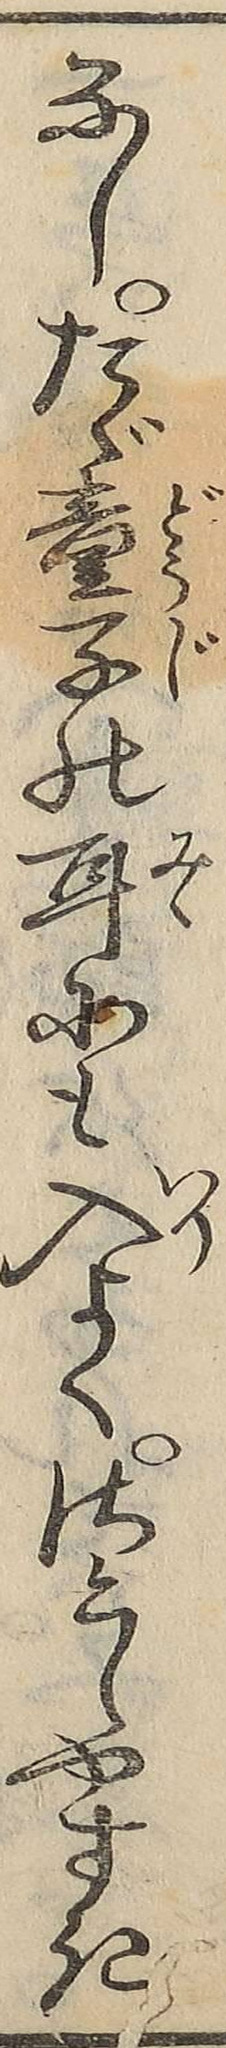なし。たゞ童子の耳にも入よく。さとしやすき
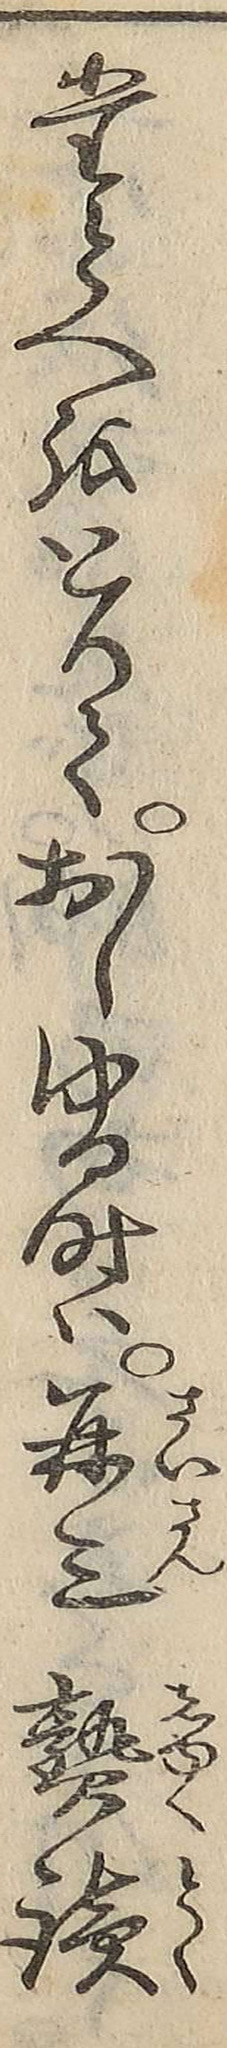たとへをとりて。おしゆる時は。再三熟読
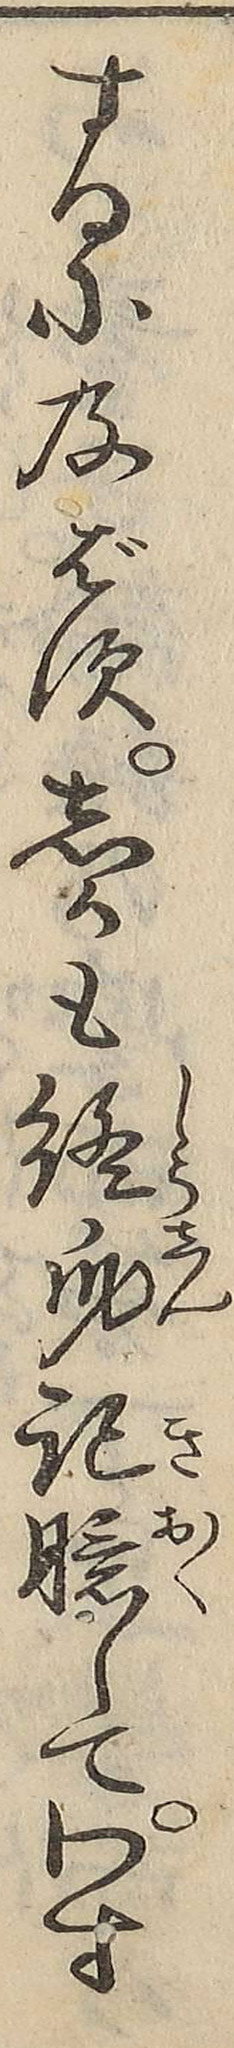するに及ばす。しかも終身記臆して。わす
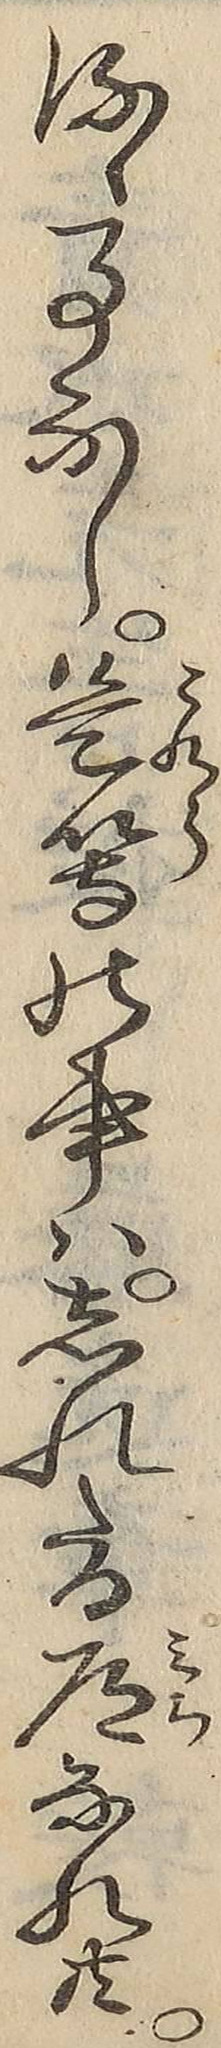るゝ事なし。是等の事は。しれたる道なれ共。
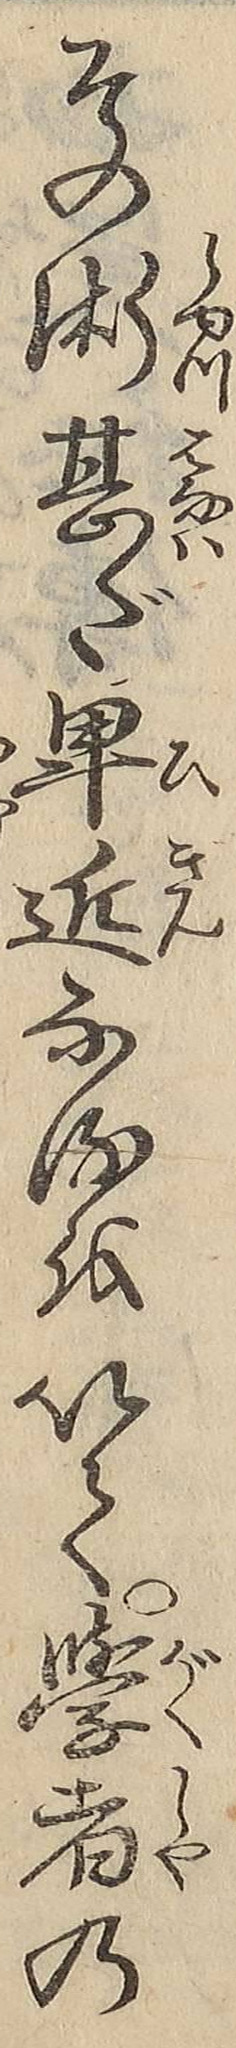その術甚だ卑近なるを以て。学者の
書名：物覺秘傳
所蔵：神戸大学附属図書館 国文学研究資料館
